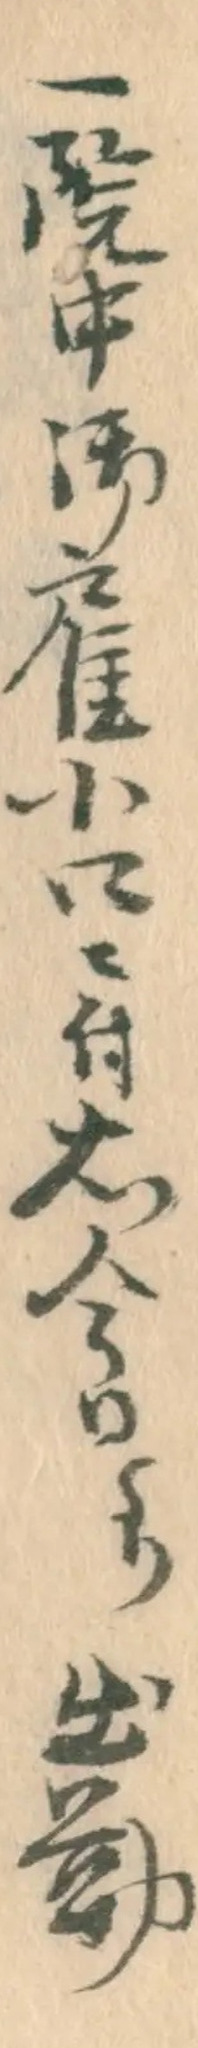一院中御雇小口ニ付右今日より出勤
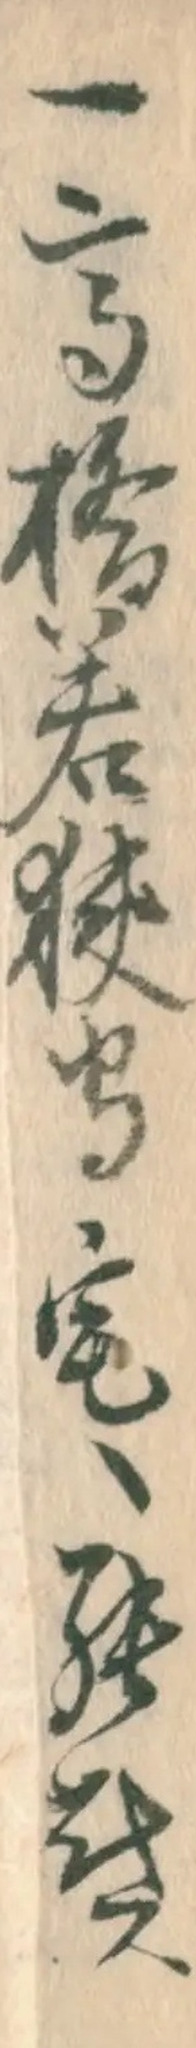一高橋若狭守宅へ罷越ス
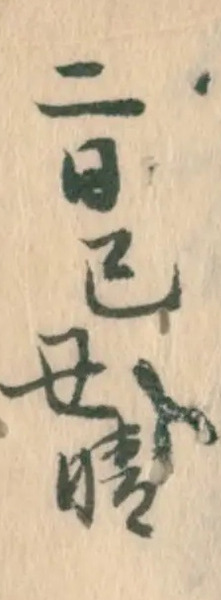二日己丑晴
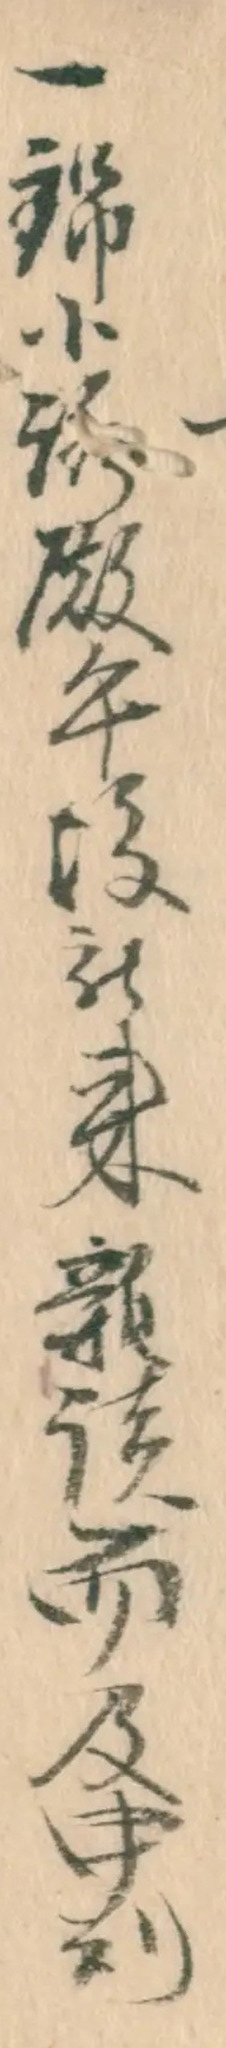一錦小路殿午後被来雑談而及申刻
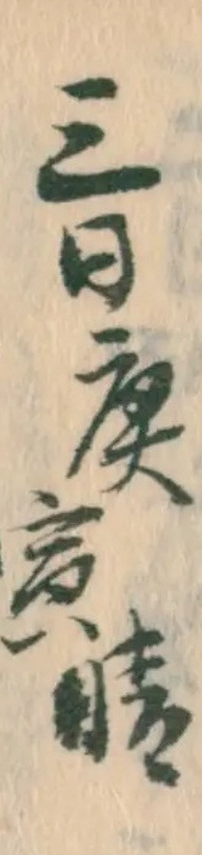三日庚寅晴
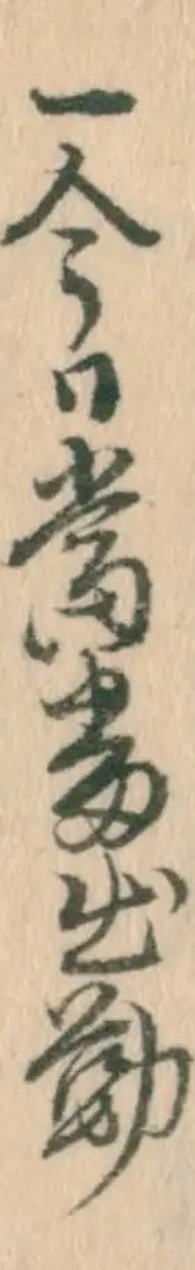一今日当番出勤
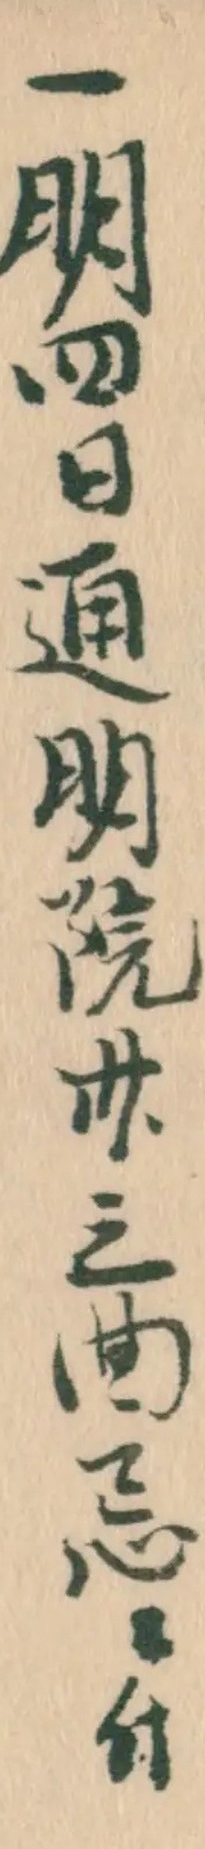一明四日通明院卅三回忌ニ付
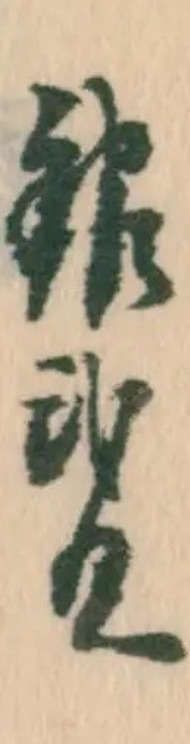銀弐匁
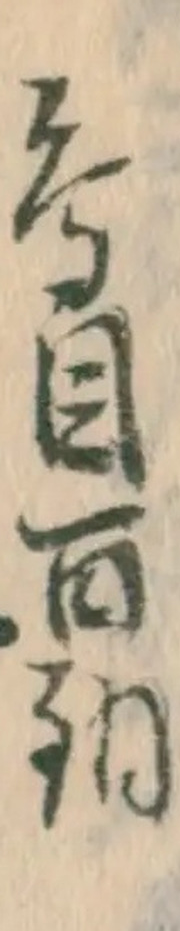鳥目百銅
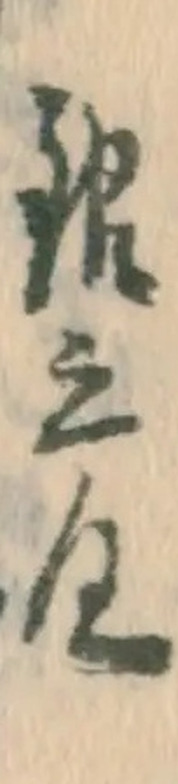銀三匁
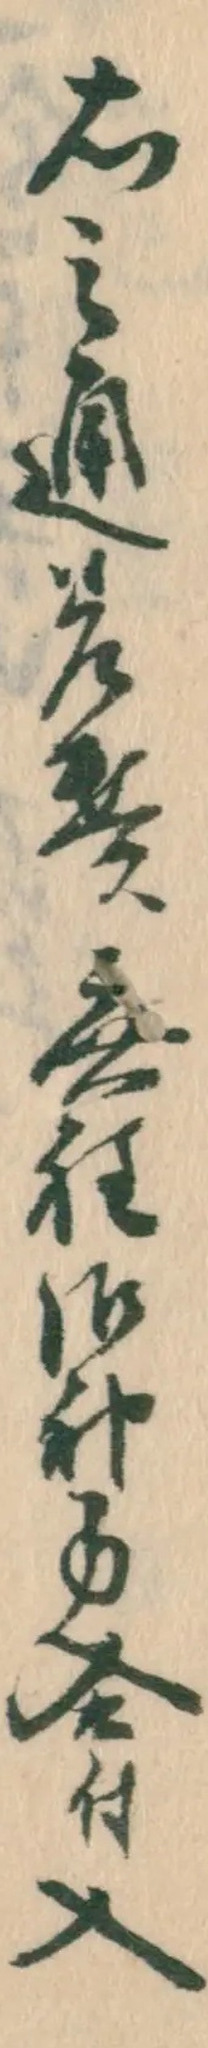右之通差遣ス無程御神事合付入
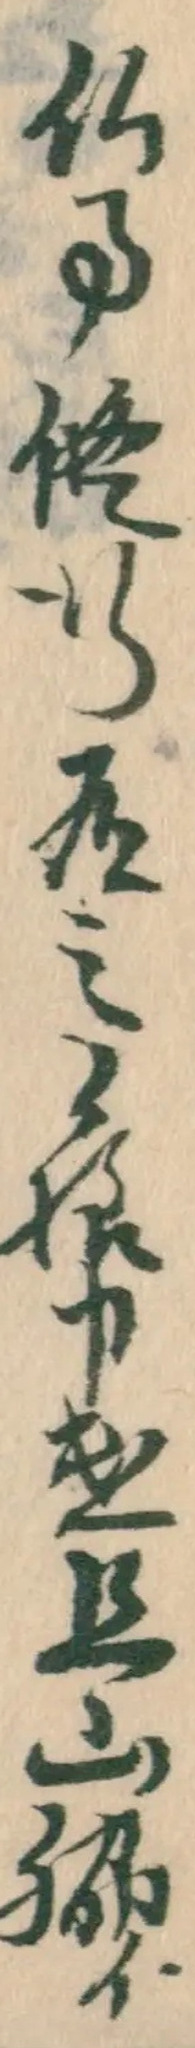仏事修行有之候様申遣且山脇ゟ
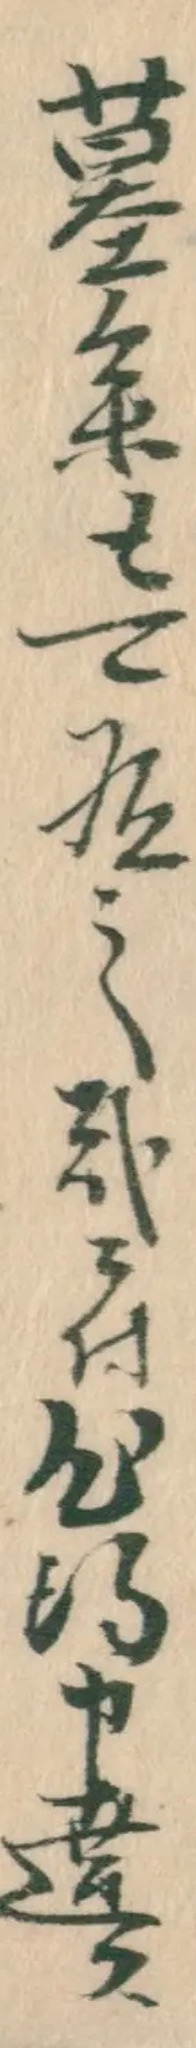墓参も可有之哉ニ付心得申達ス
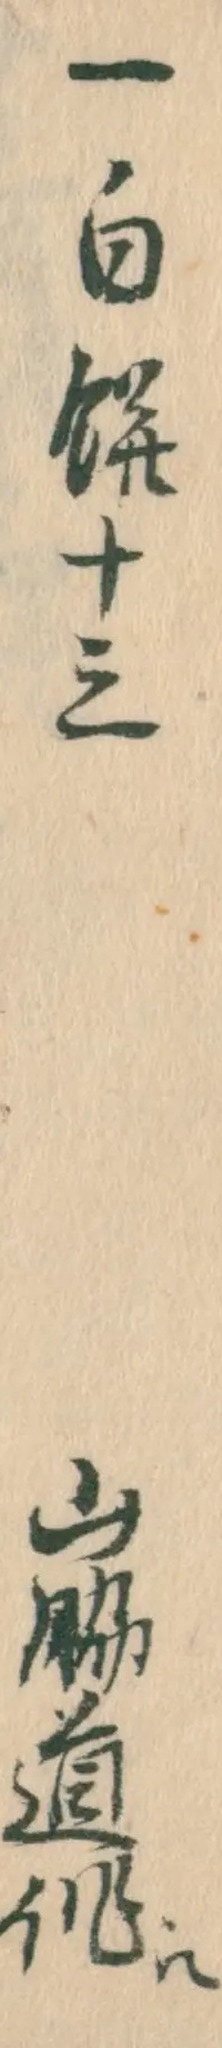一白餠十三山脇道作え
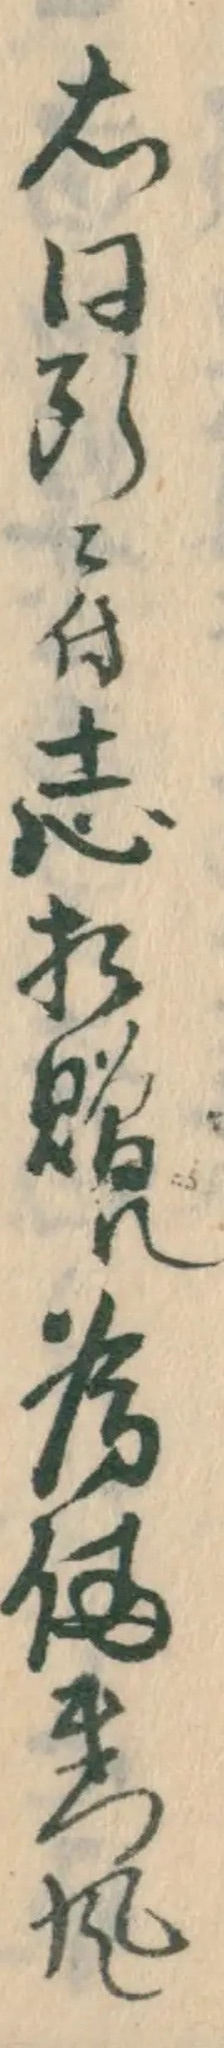右同断ニ付志相贈ル為備まつ風
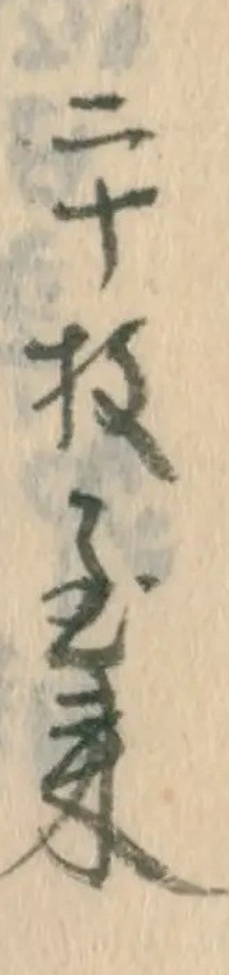二十枚到来
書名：禁裏御所御用日記. [131]
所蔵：国立国会図書館 National Diet Library, JAPAN
